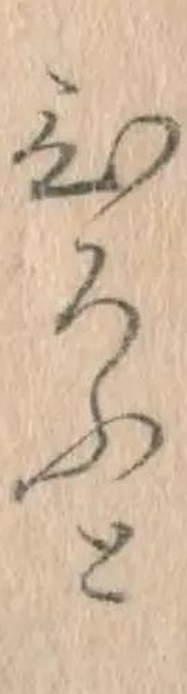ひろふと
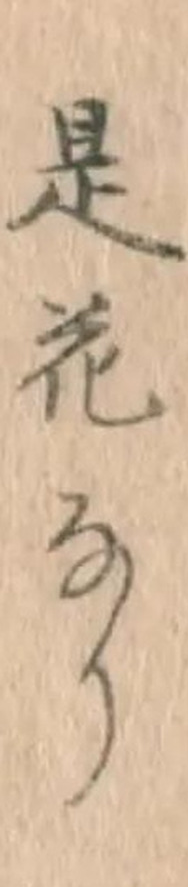是花なり

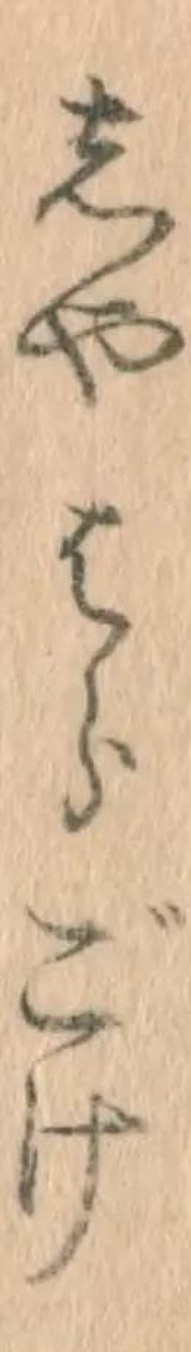しやはらごけ
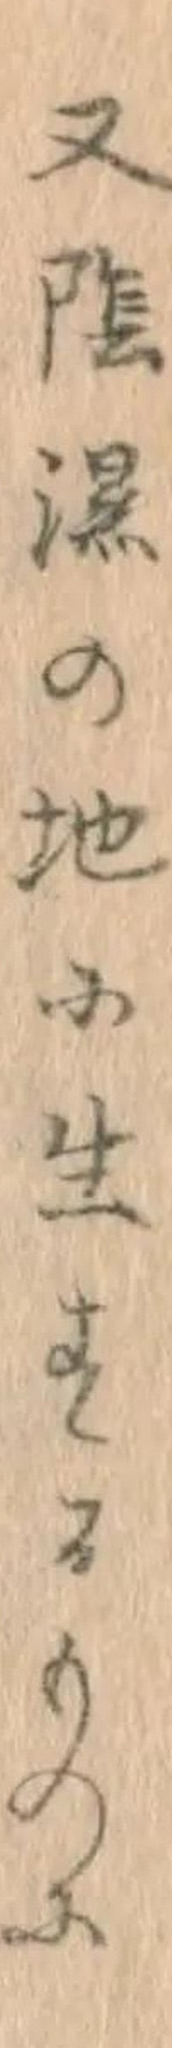又陰湿の地に生するものに
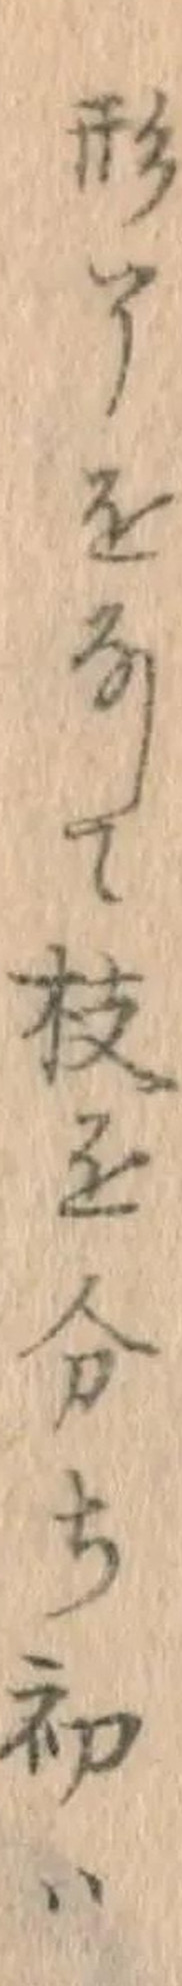形丫をなして枝を分ち初は
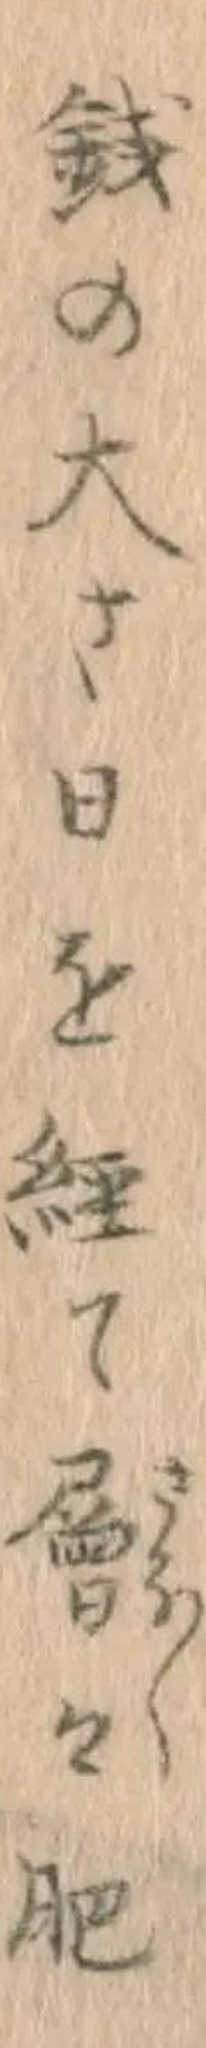銭の大さ日を経て層々肥
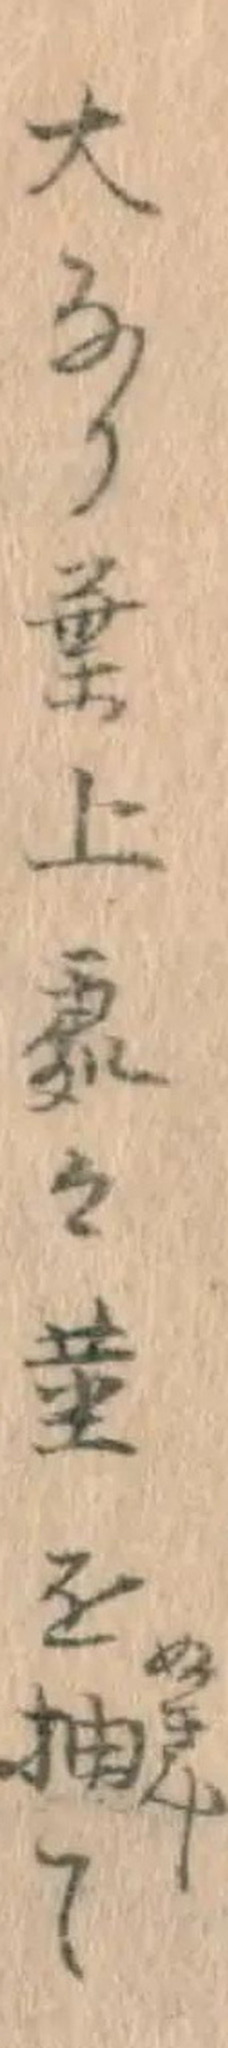大なり葉上処々茎を抽て
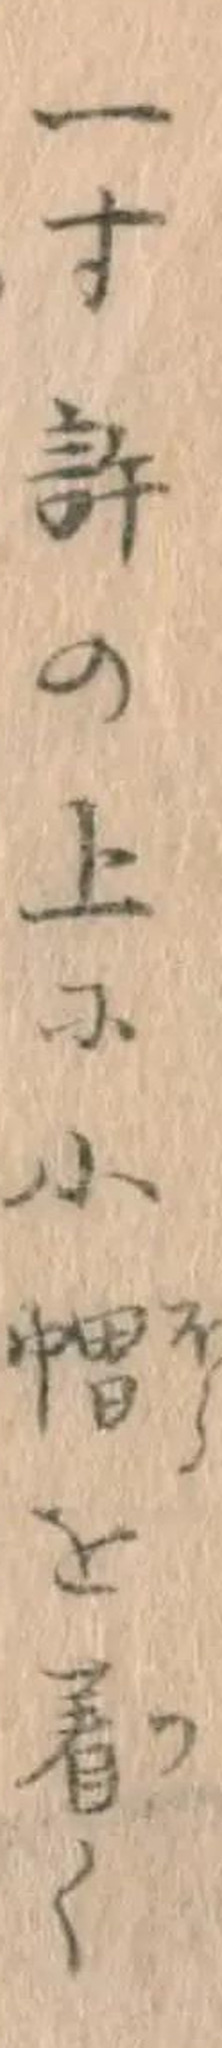一寸許の上に小帽を着く
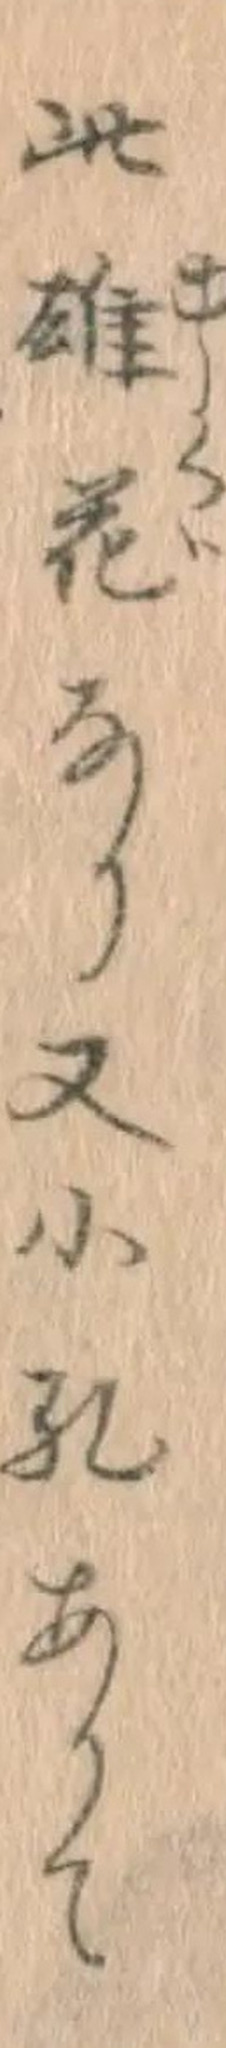此雄花なり又小孔ありて
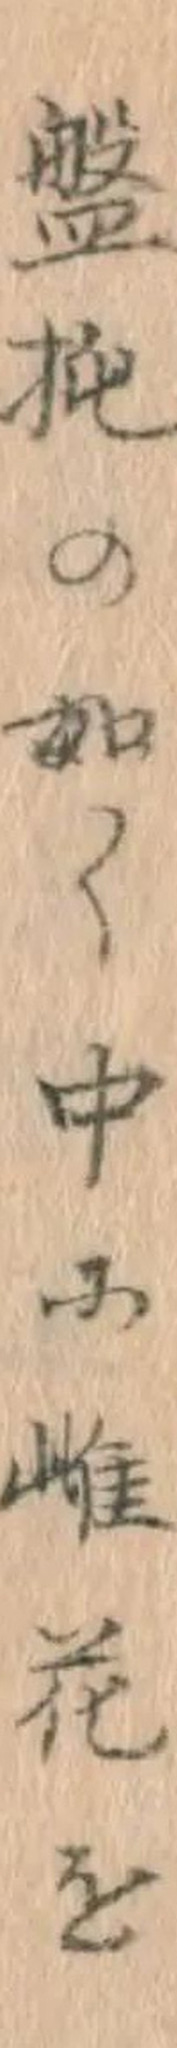盤扽の如く中に雌花を
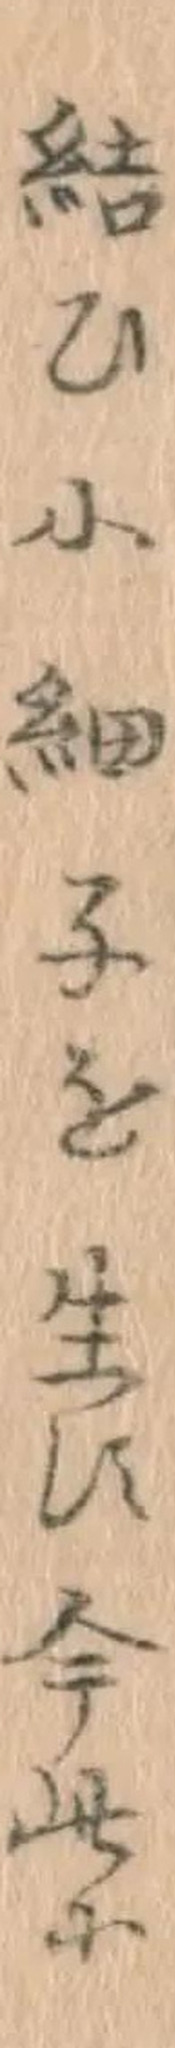結ひ小細子を生す今此に
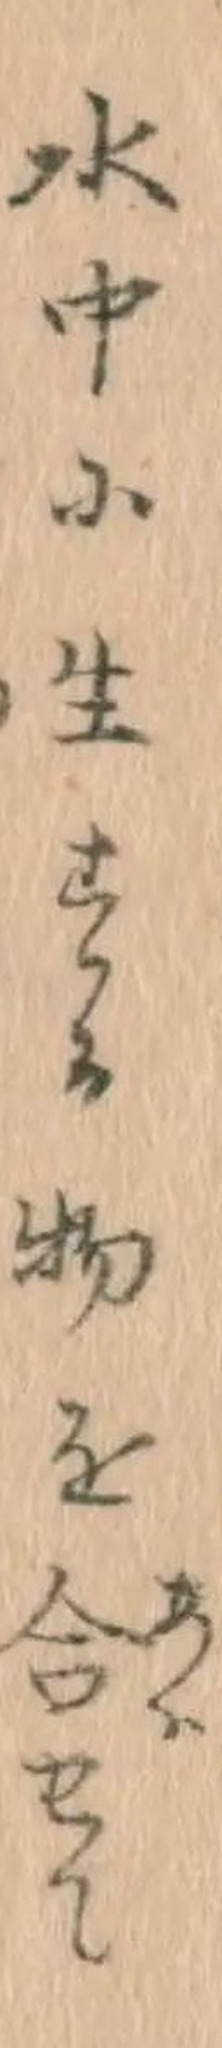水中に生する物を合せて
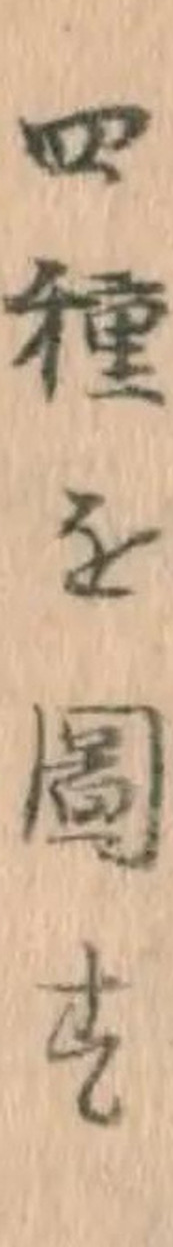四種を図す
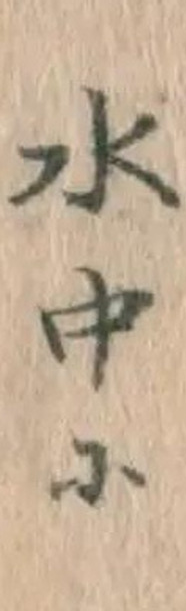水中に
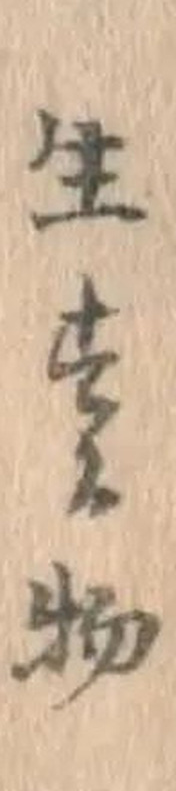生する物

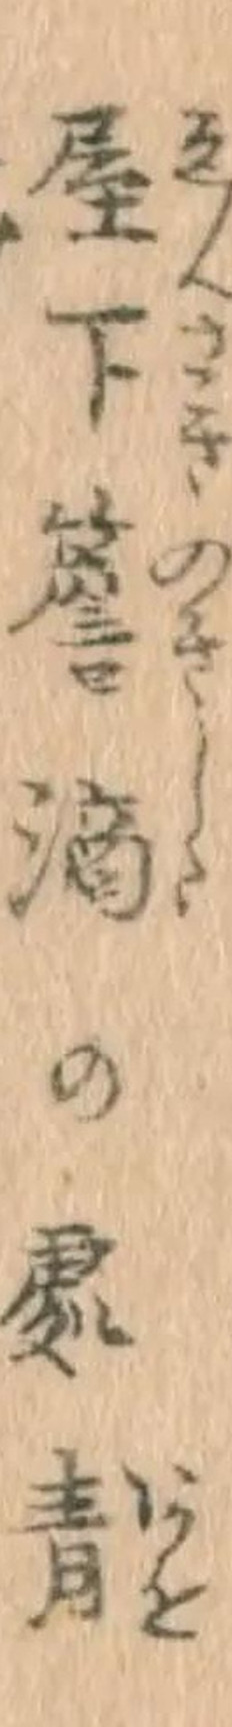屋下簷滴の処青
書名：本草図譜. 巻37-39
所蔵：国立国会図書館 National Diet Library, JAPAN
